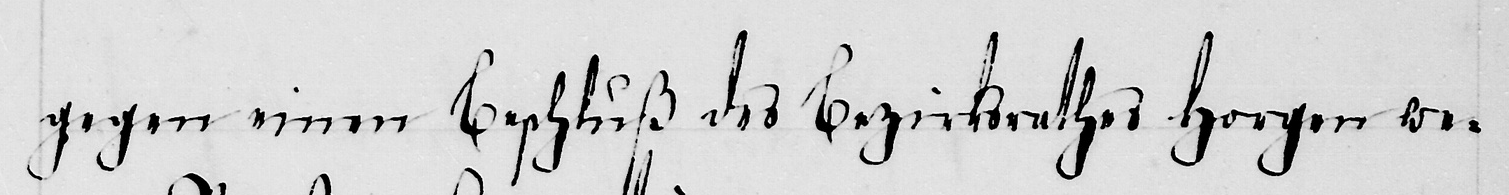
gegen einen Beschluß des Bezirksrathes Horgen we¬
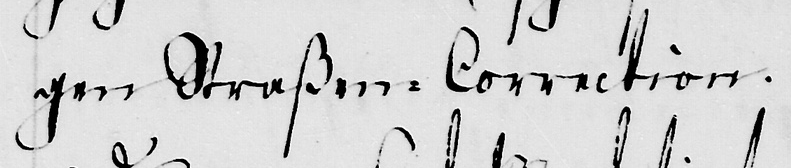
gen Straßen-Correction.
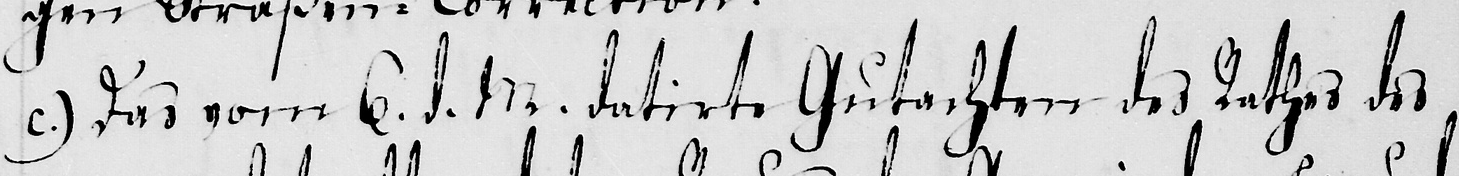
c.) Das vom 6. d. M. datirte Gutachten des Rathes des
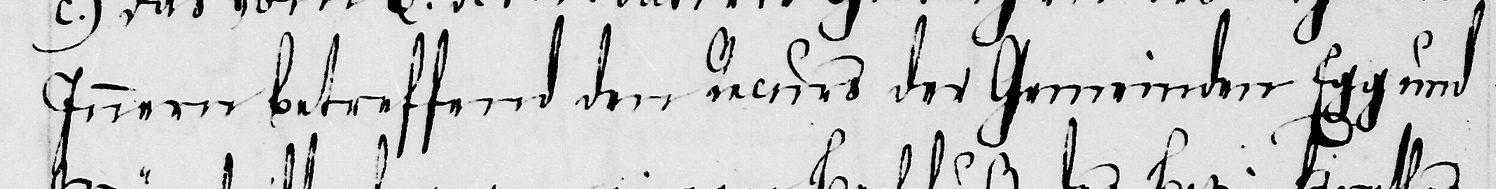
Innern betreffend den Recurs der Gemeinden Egg und
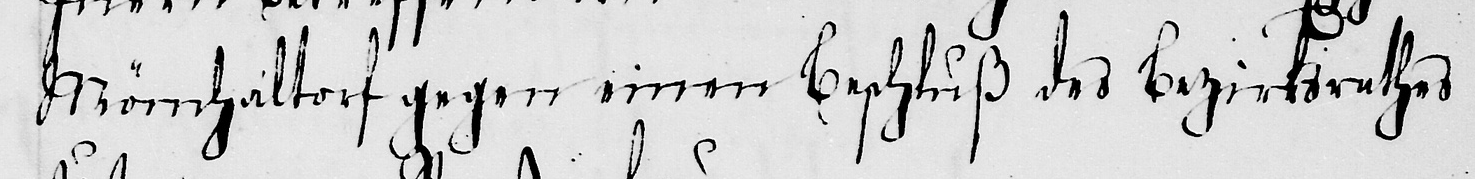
Mönchaltorf gegen einen Beschluß des Bezirksrathes
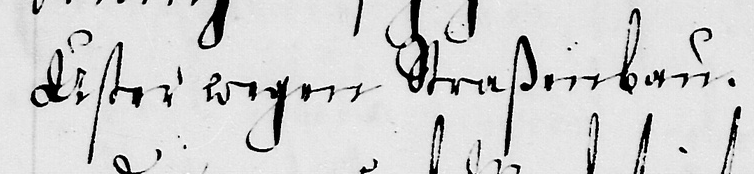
Uster wegen Straßenbau.
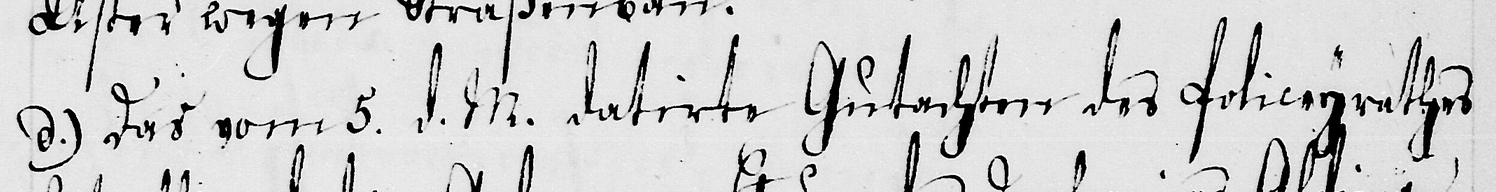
d.) Das vom 5. d. M. datirte Gutachten des Policeyrathes
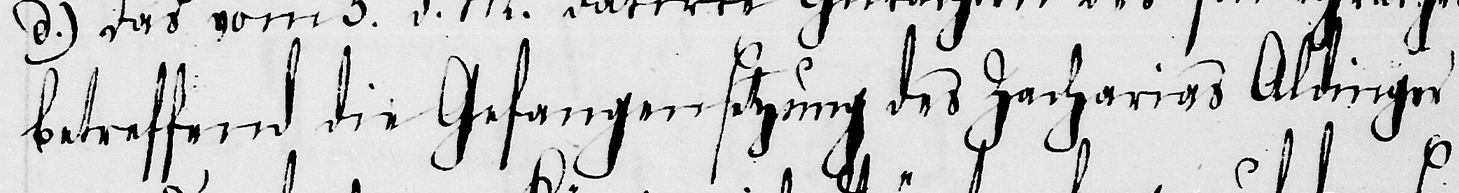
betreffend die Gefangensetzung des Zacharias Aldinger
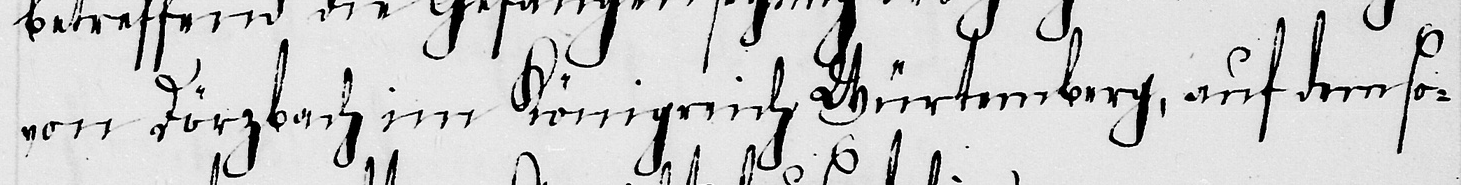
von Dörzbach im Königreich Würtemberg, auf dem so¬
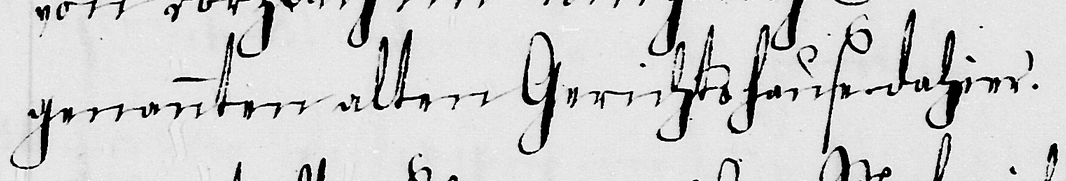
genannten alten Gerichtshause dahier.
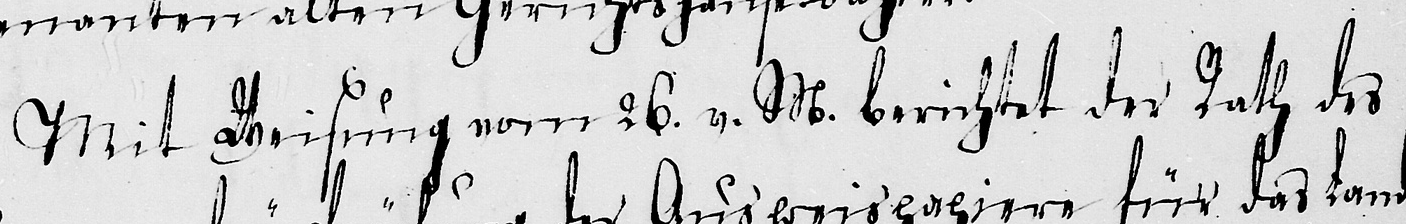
Mit Weisung vom 26. v. M. berichtet der Rath des
